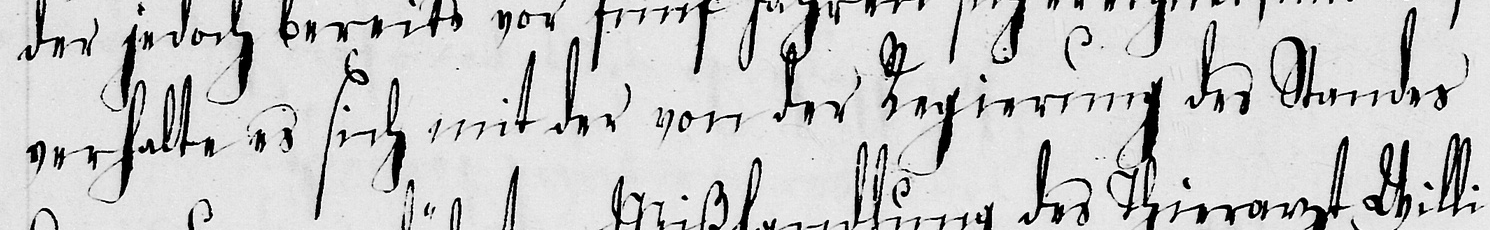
verhalte es sich mit der von der Regierung des Standes
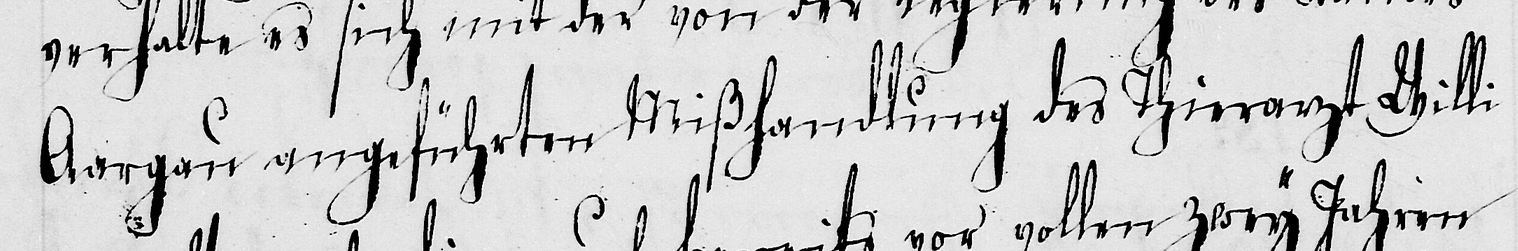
Aargau angeführten Mißhandlungen des Thierarzt Willi
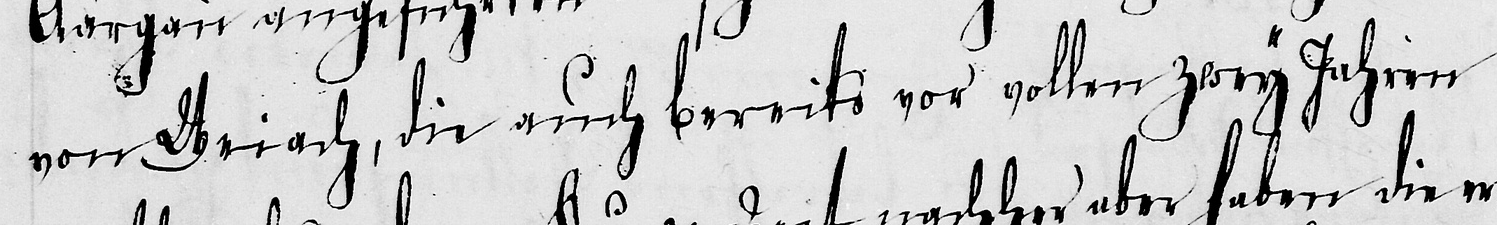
von Weiach, die auch bereits vor vollen zwey Jahren
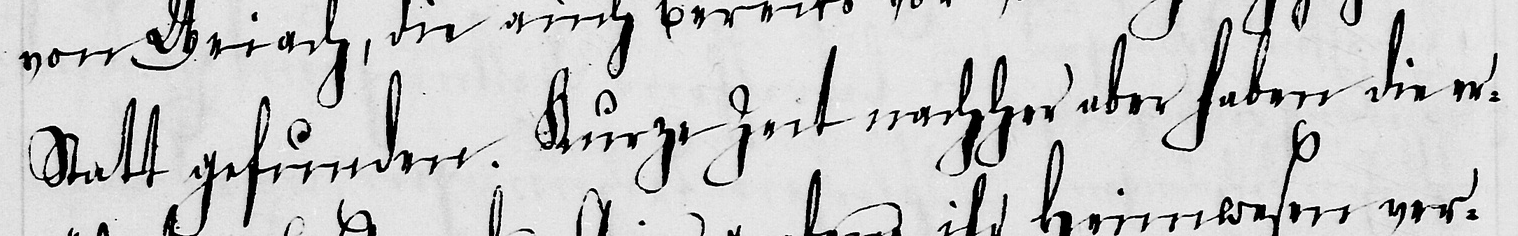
Statt gefunden. Kurze Zeit nachher aber haben die er¬
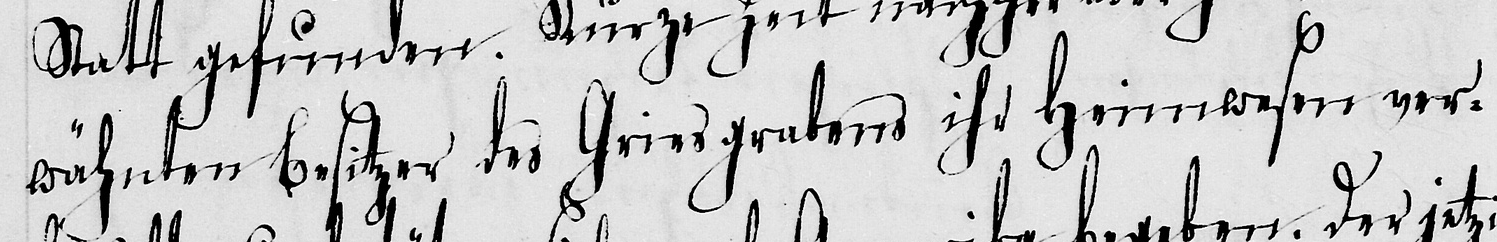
wähnten Besitzer des Griesgrabens ihr Heimwesen ver¬
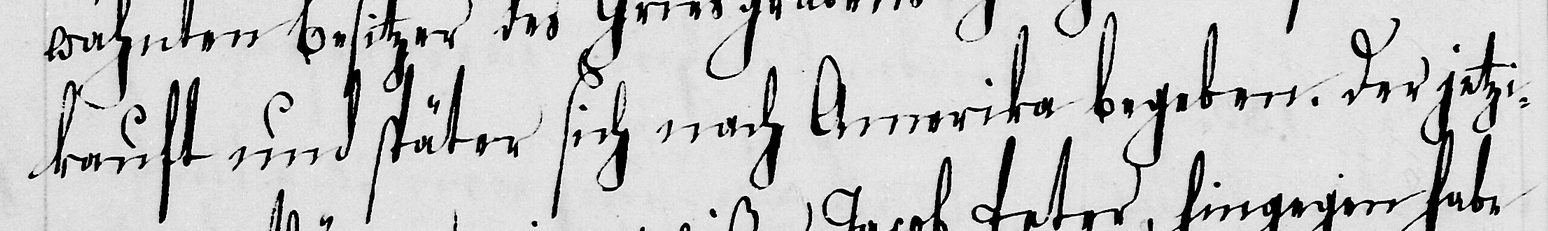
kauft und später sich nach Amerika begeben. Der jetz¬
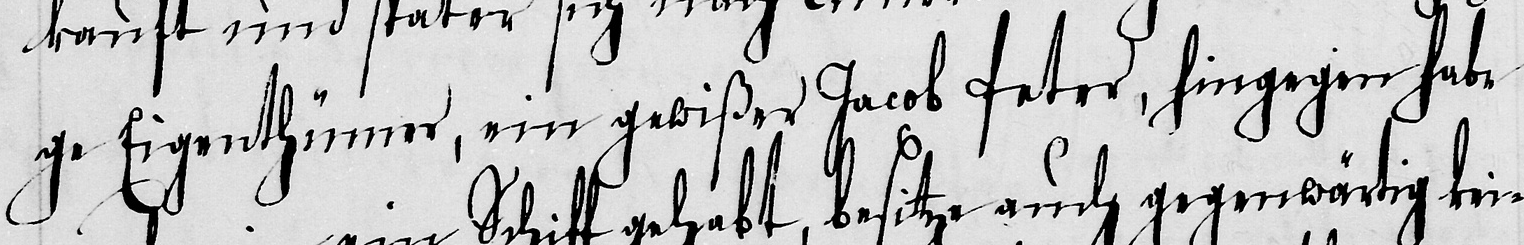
ige Eigenthümer, ein gewißer Jacob Peter, hingegen habe
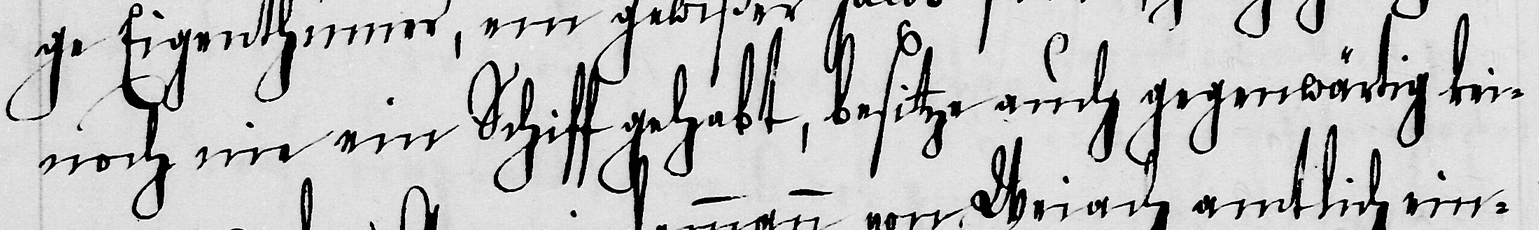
noch nie ein Schiff gehabt, besitze auch gegenwärtig kei¬
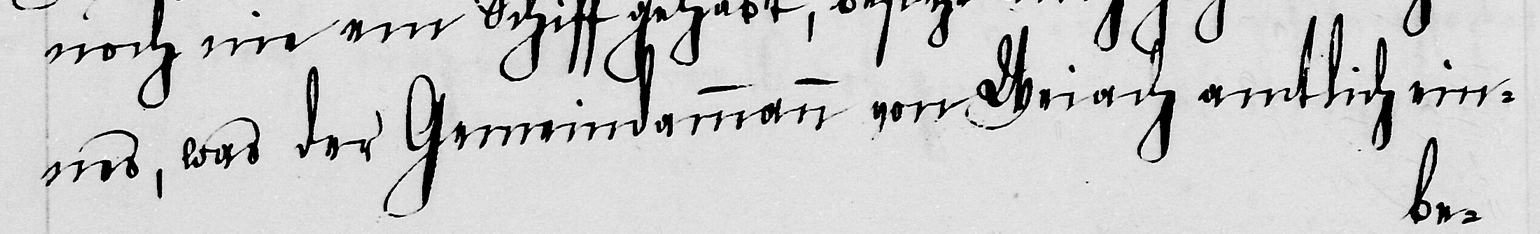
nes, was der Gemeindammann von Weiach amtlich ein-
